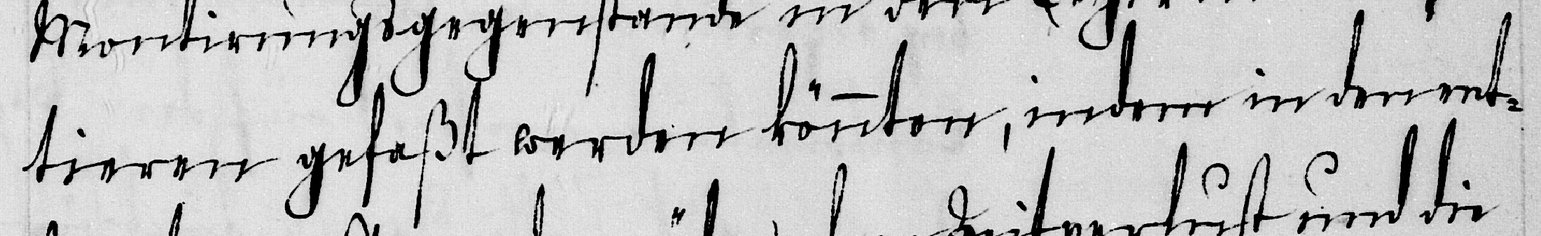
tieren gefaßt werden könnten, indem in den ent¬
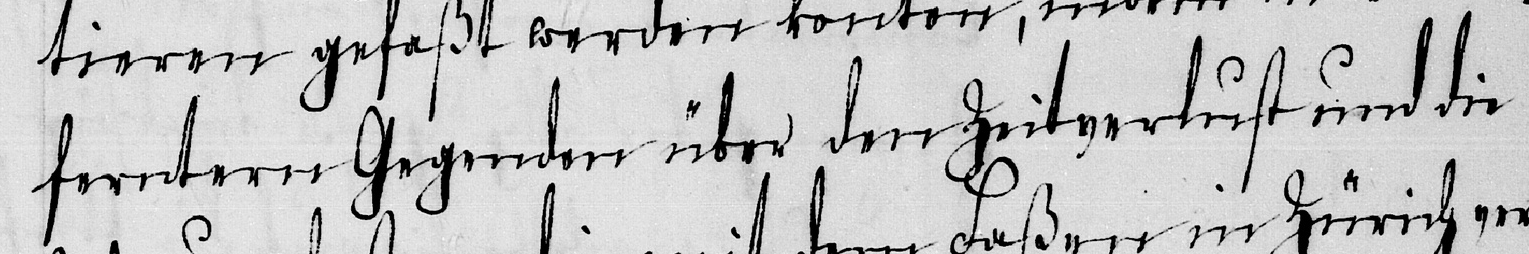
ferntern Gegenden über den Zeitverlust und die
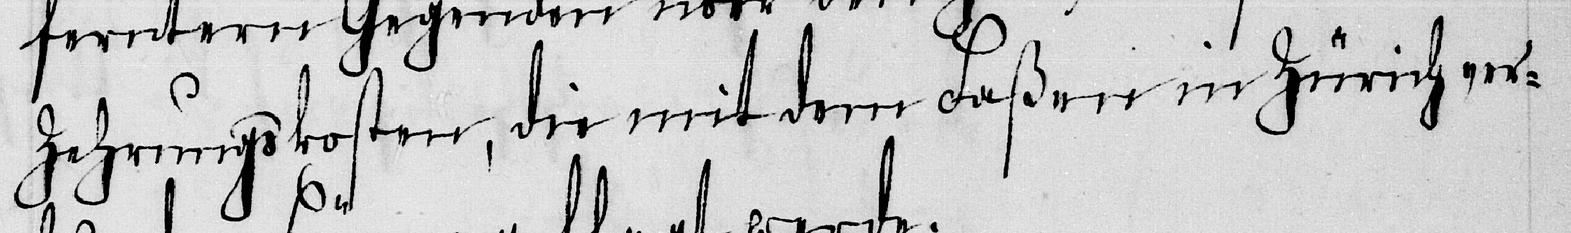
Zehrungskosten, die mit dem Faßen in Zürich ver¬
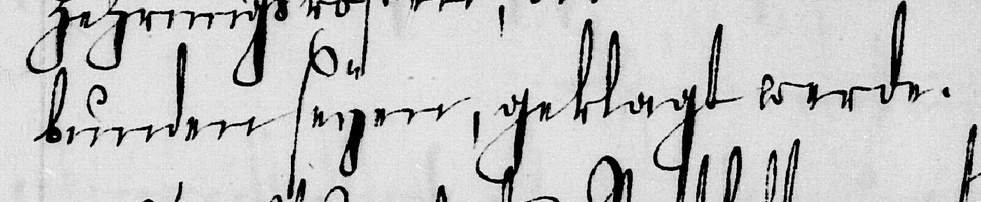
bunden seyen, geklagt werde.
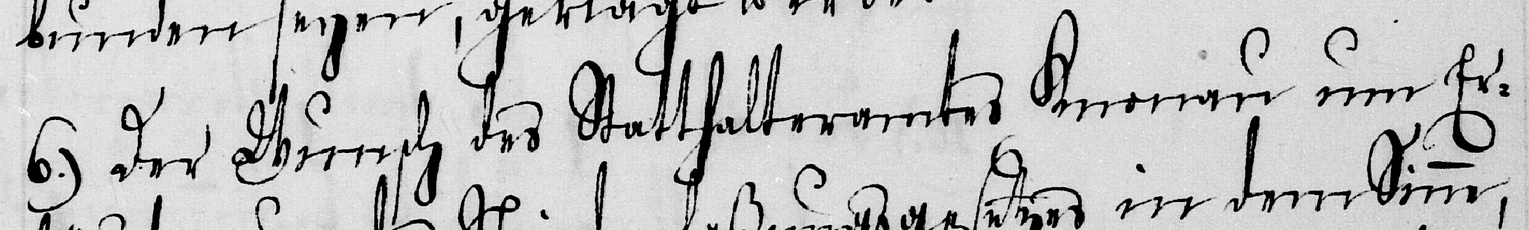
6.) Der Wunsch des Statthalteramtes Knonau um Er¬
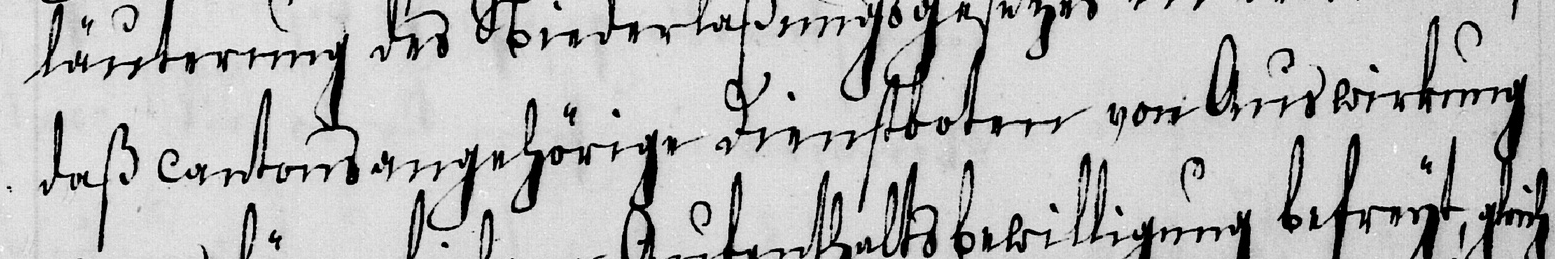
daß cantonsangehörige Dienstboten von Auswirkung
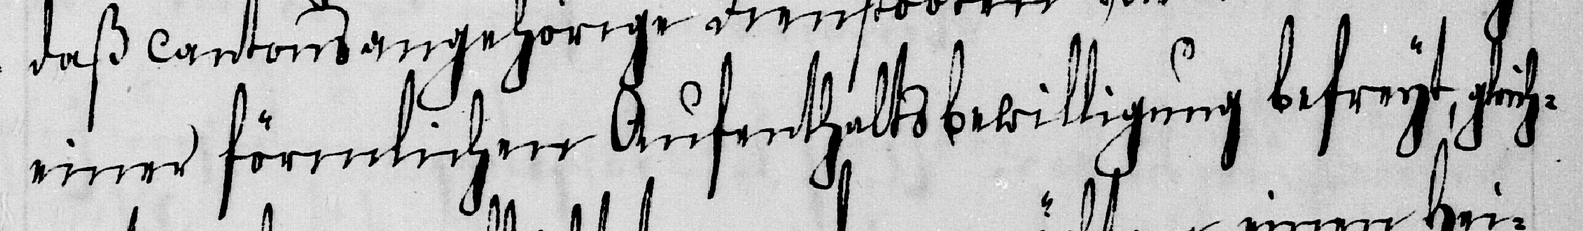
einer förmlichen Aufenthaltsbewilligung befreyt, glei¬
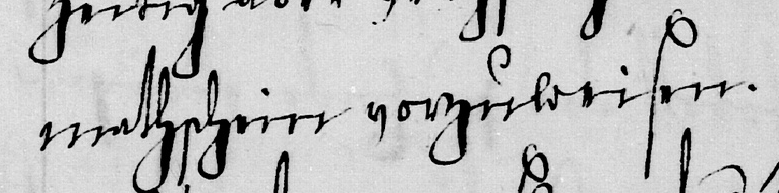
mathschein vorzuweisen.
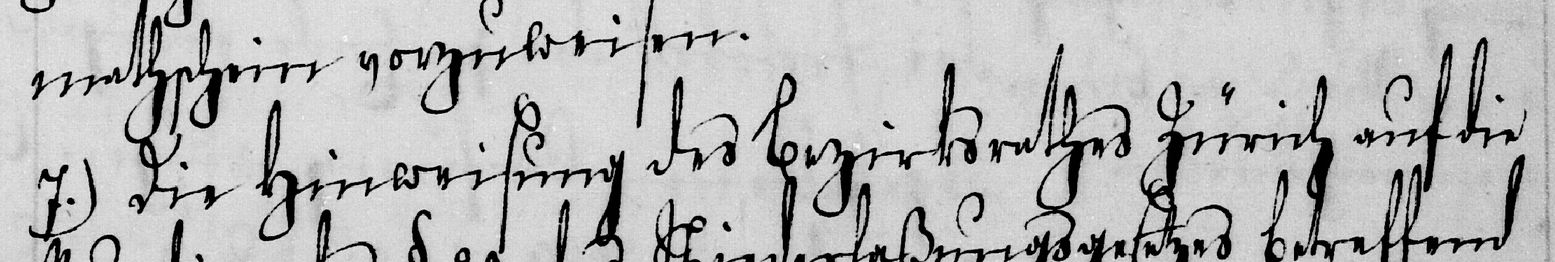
7.) Die Hinweisung des Bezirksrathes Zürich auf die
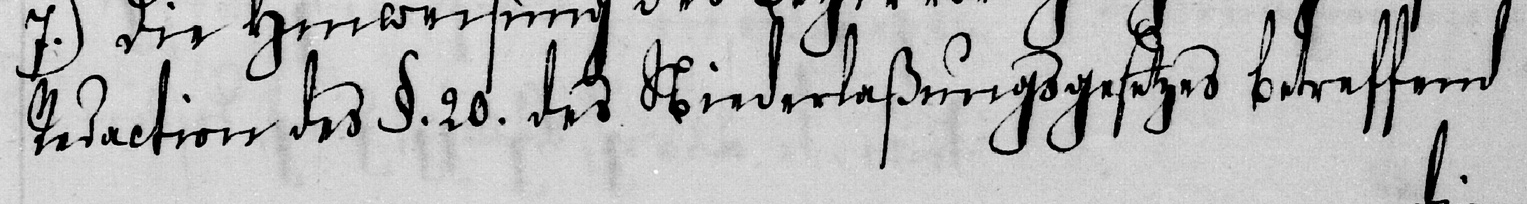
Redaction des §. 20. des Niederlaßungsgesetzes betreffend
